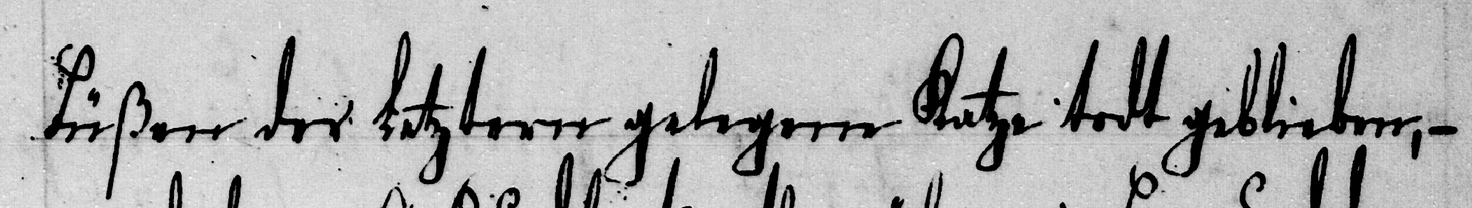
Füßen der Letztern gelegene Katze todt geblieben,
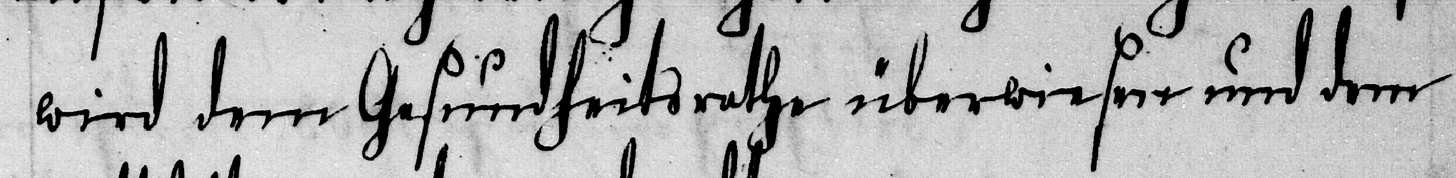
wird dem Gesundheitsrathe überwiesen und dem
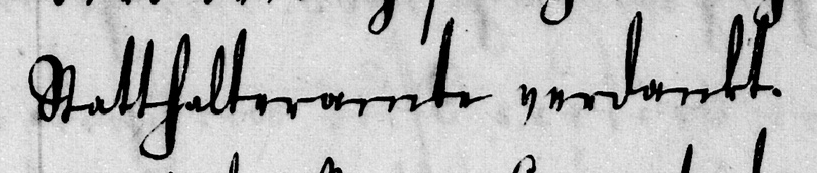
Statthalteramte verdankt.
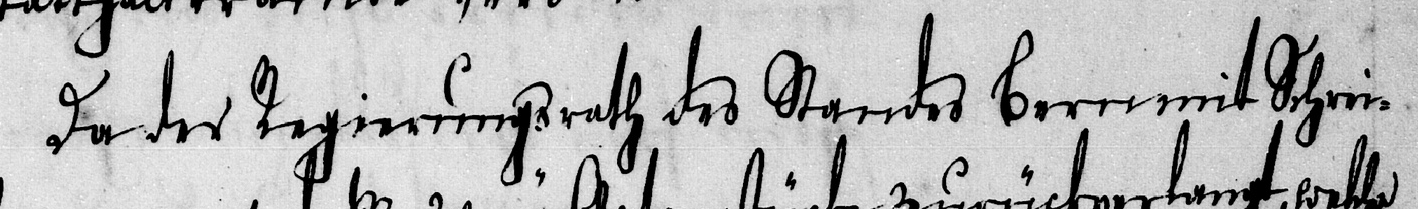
Da der Regierungsrath des Standes Bern mit Schrei¬
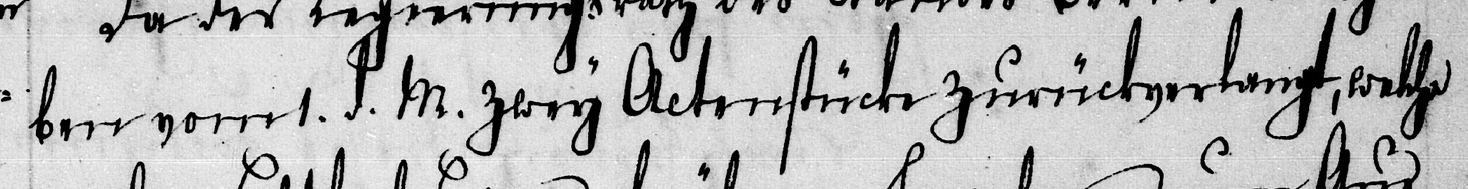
ben vom 1. d. M. zwey Actenstücke zurückverlangt, welche
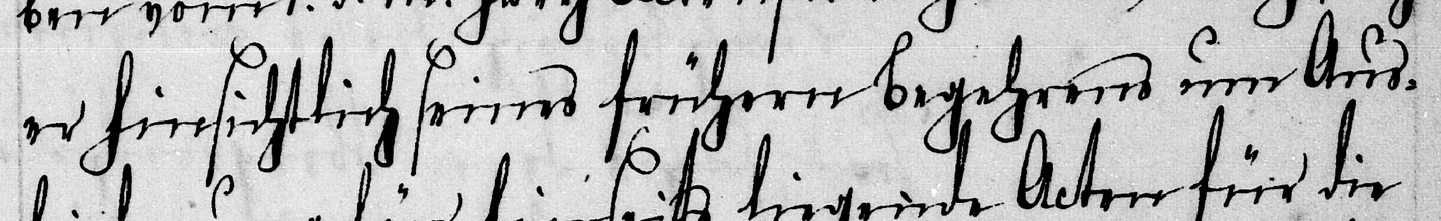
er hinsichtlich seines frühern Begehrens um Aus¬
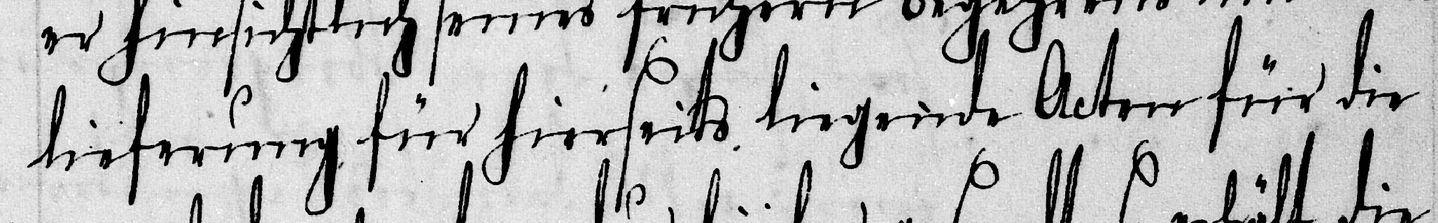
lieferung für hierseits liegende Acten für die
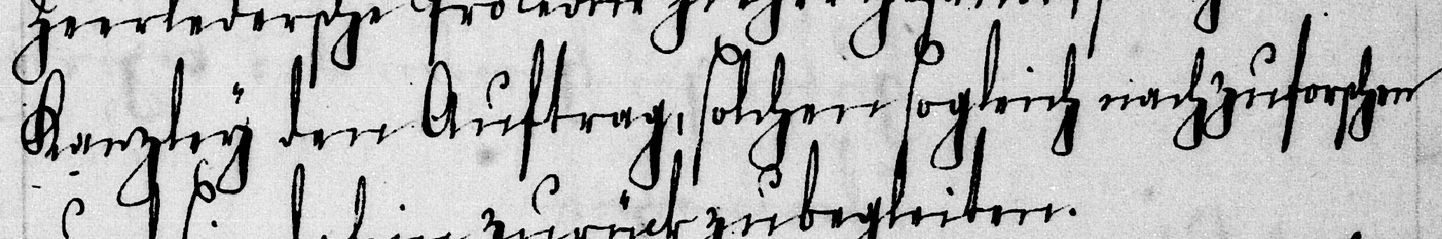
Kanzley den Auftrag, solchen sogleich nachzuforsch¬
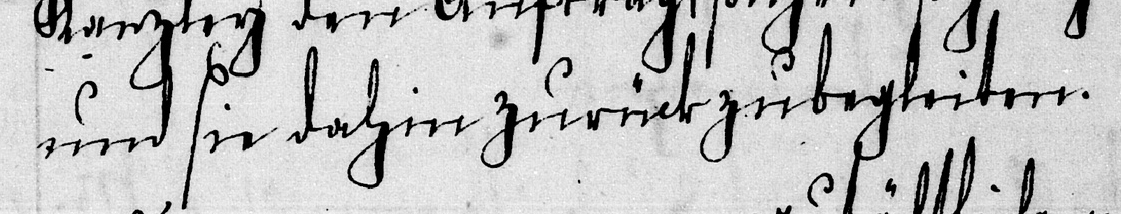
und sie dahin zurückzubegleiten.
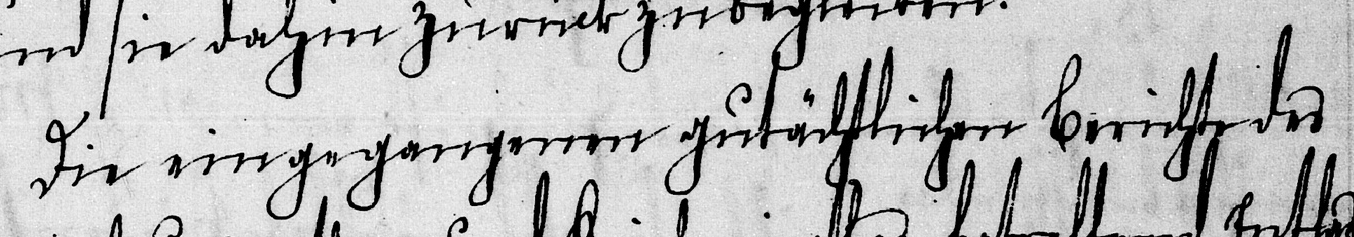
Die eingegangenen gutächtlichen Berichte des
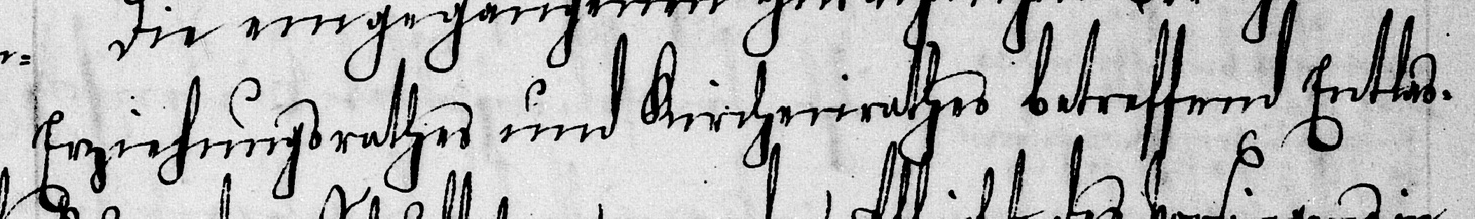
Erziehungsrathes und Kirchenrathes betreffend Entla¬
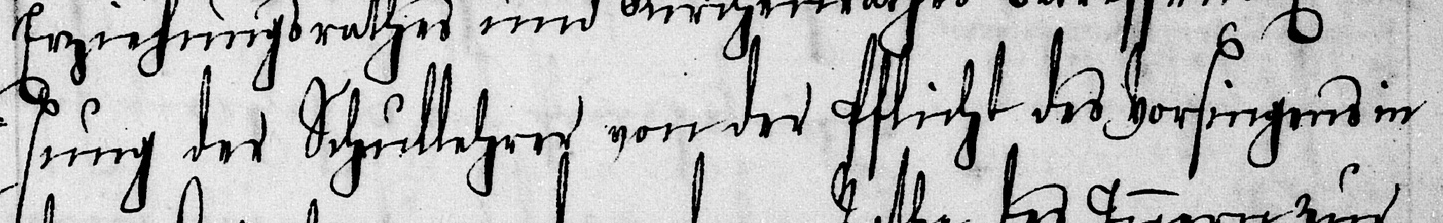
ßung der Schullehrer von der Pflicht des Vorsingens in
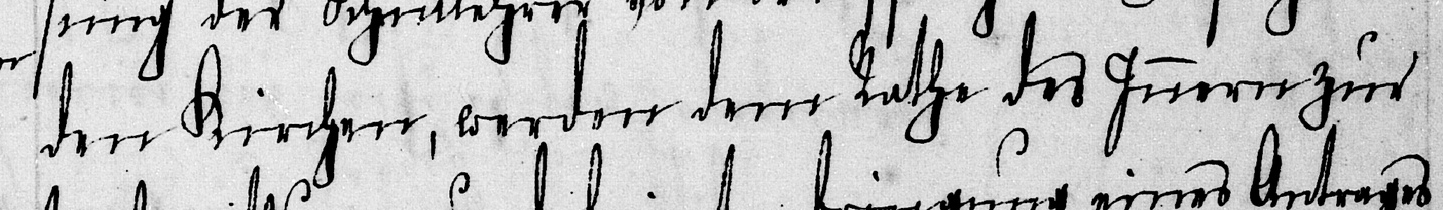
den Kirchen, werden dem Rathe des Innern zur
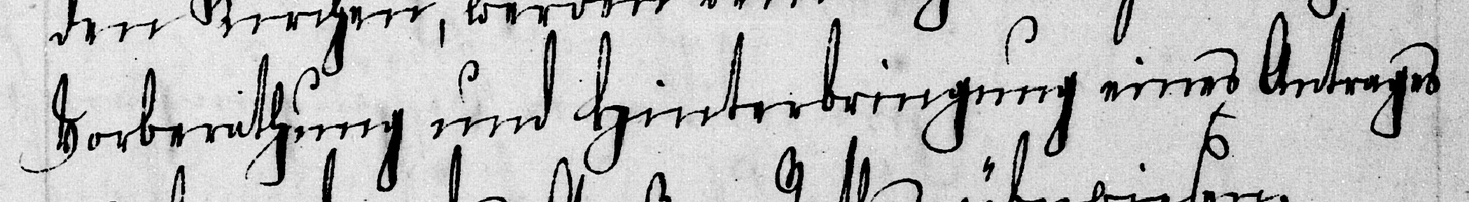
Vorberathung und Hinterbringung eines Antrages
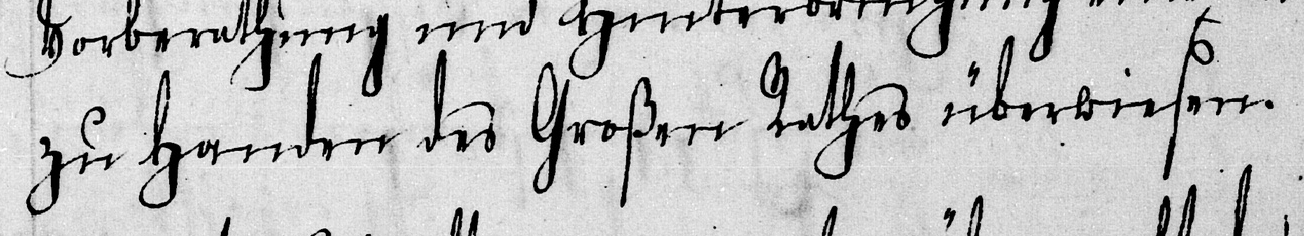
zu Handen des Großen Rathes überwiesen.
